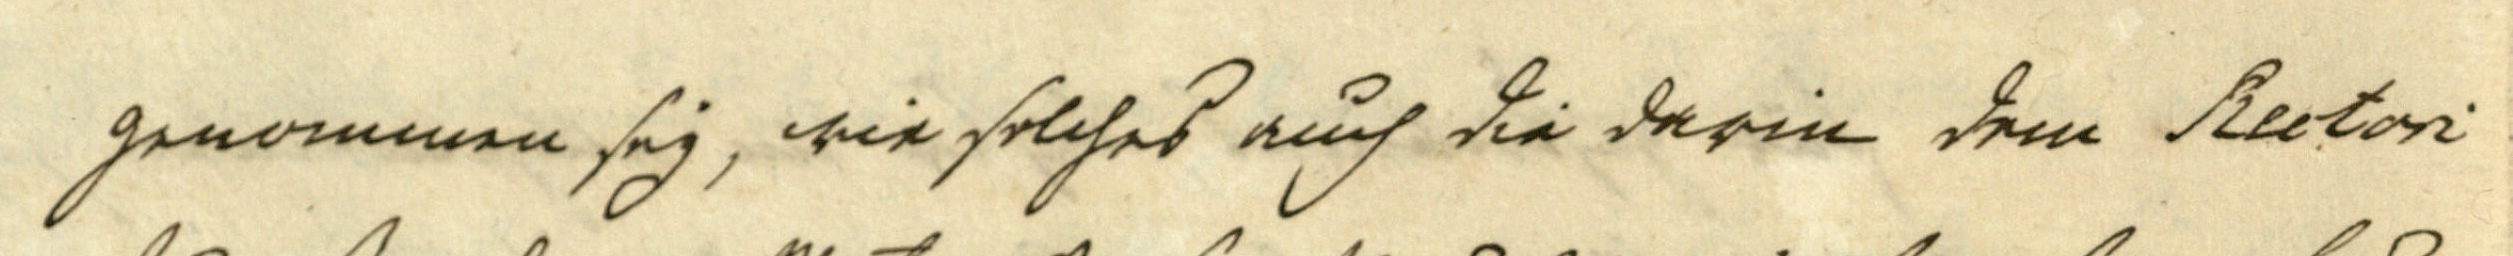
genommen seÿ, wie solches auch die darin dem Rectori
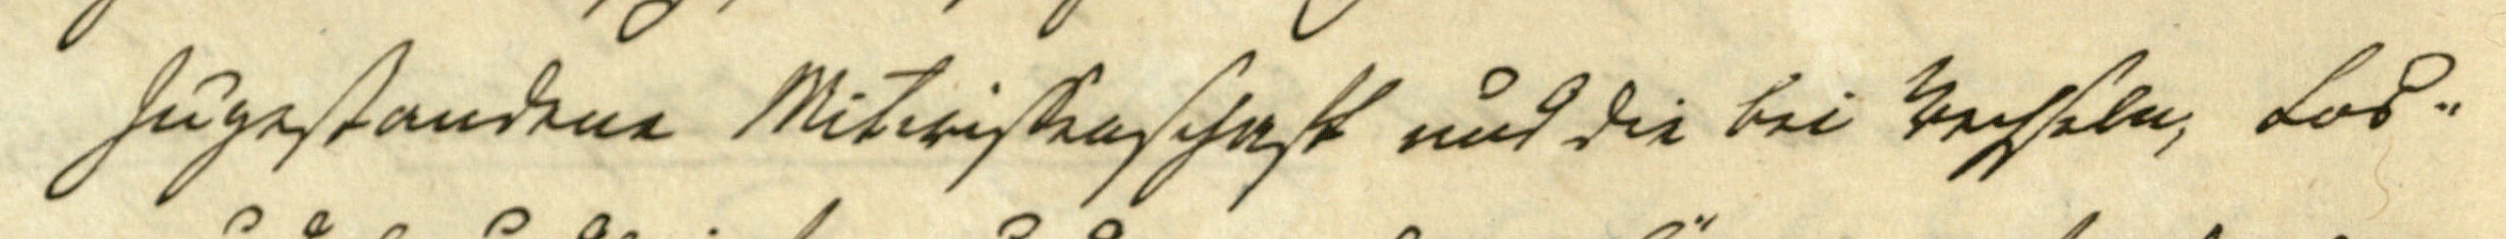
zugestandene Mitwissenschaft und die bei Wechseln, Los¬
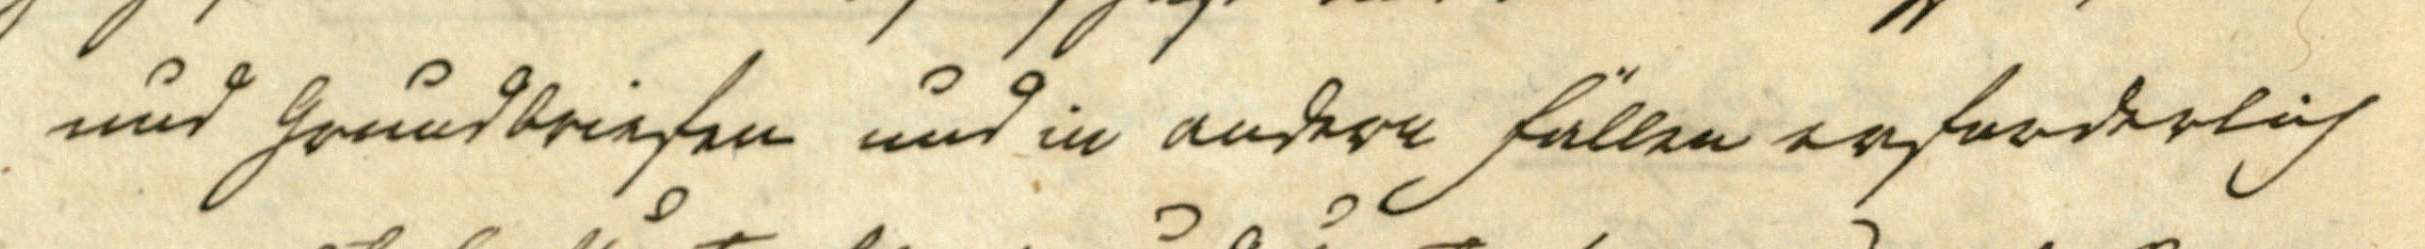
und Grundbriefen und in andern Fällen erforderlich
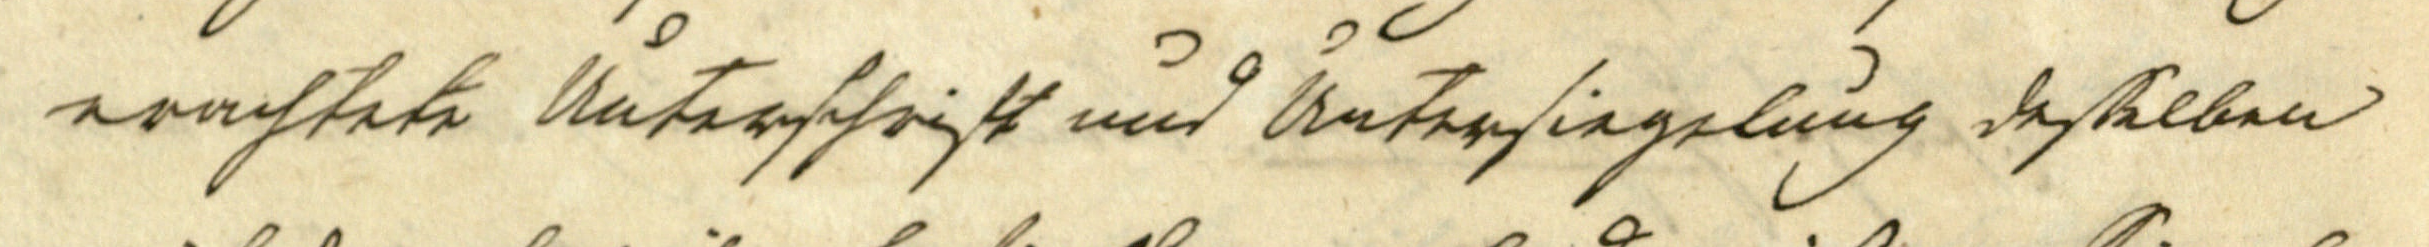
erachtete Unterschrift und Untersiegelung desselben
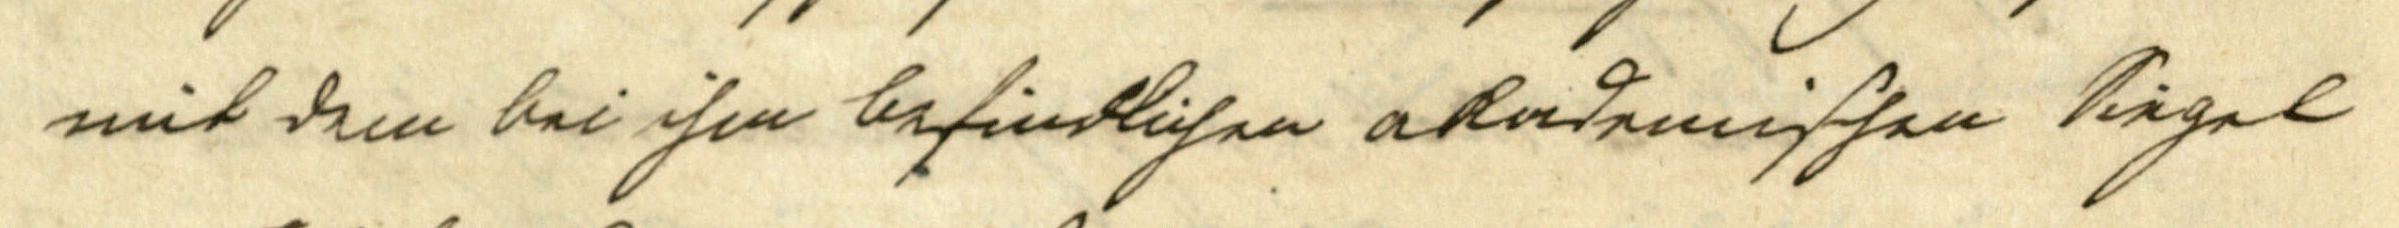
mit dem bei ihm befindlichen akademischen Siegel
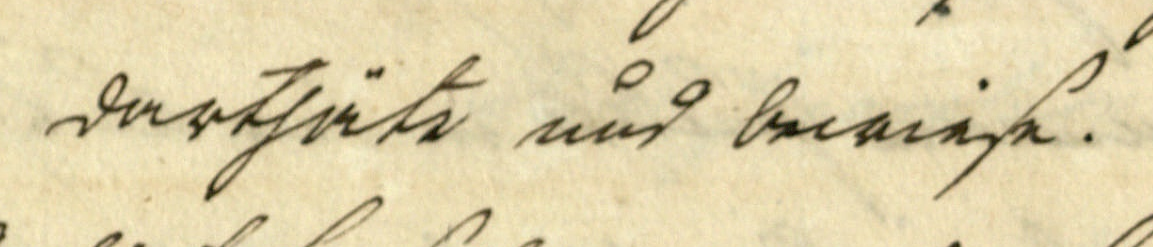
darthäte und bewiese.
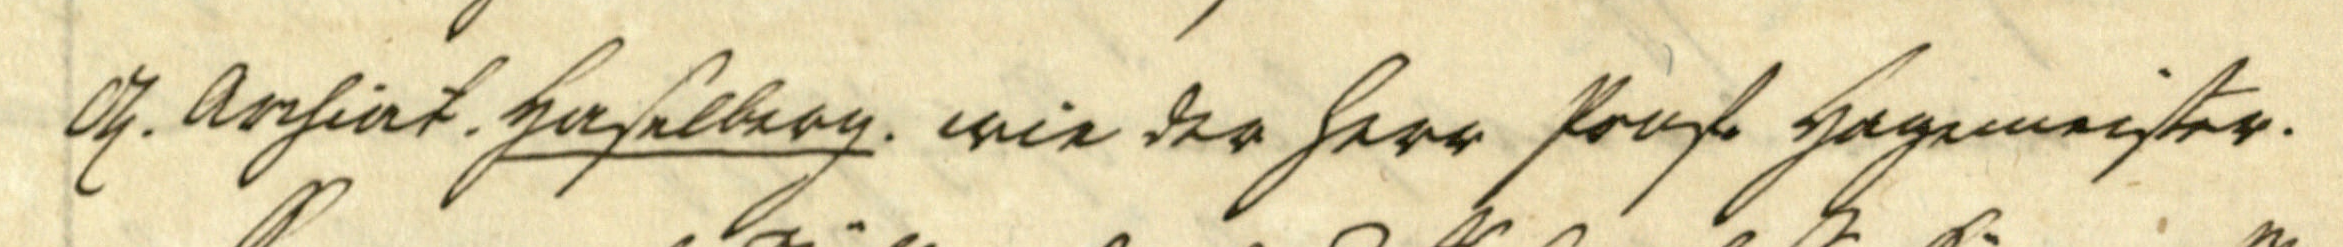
dh. Archiat. Haselberg. wie der Herr Prof. Hagemeister.
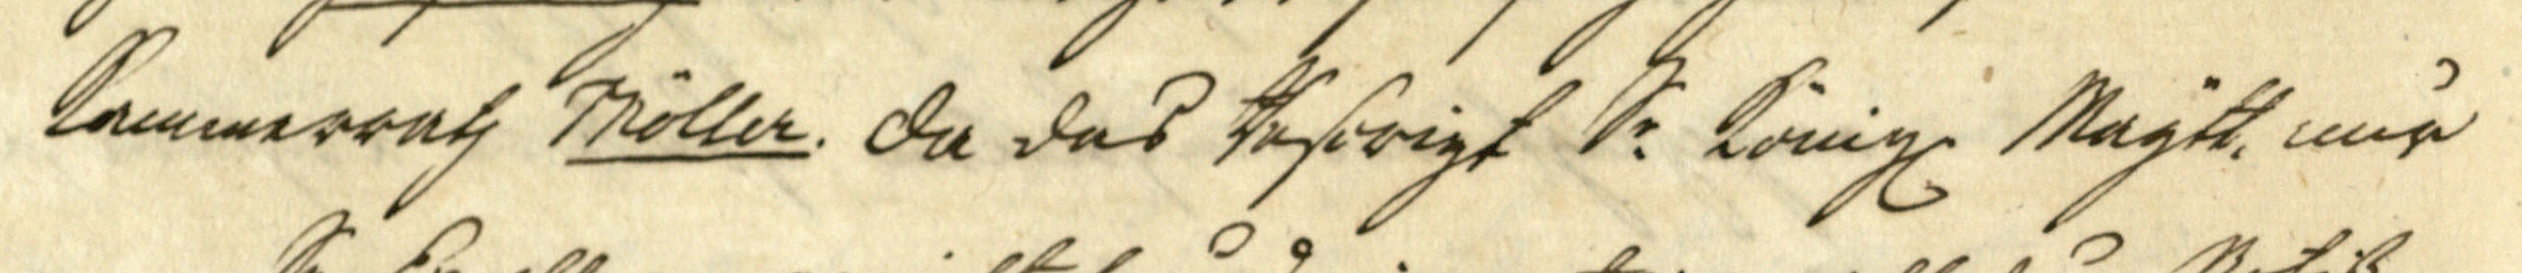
Kamerrath Möller. Da das Rescript Sr Königl. Maÿtt. nur
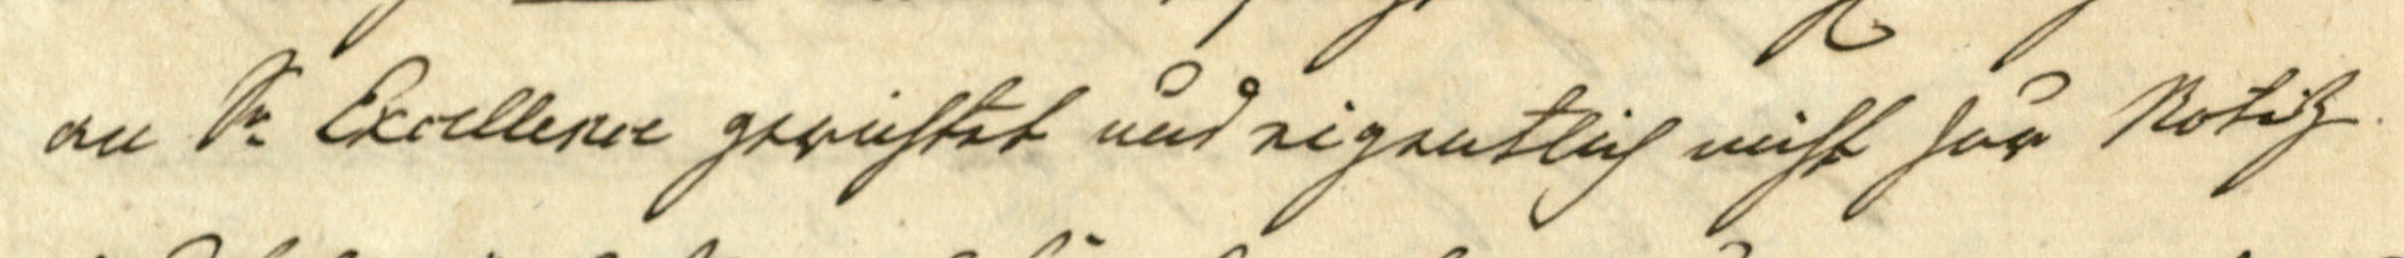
an Sr Excellence gerichtet und eigentlich nicht zur Notiz
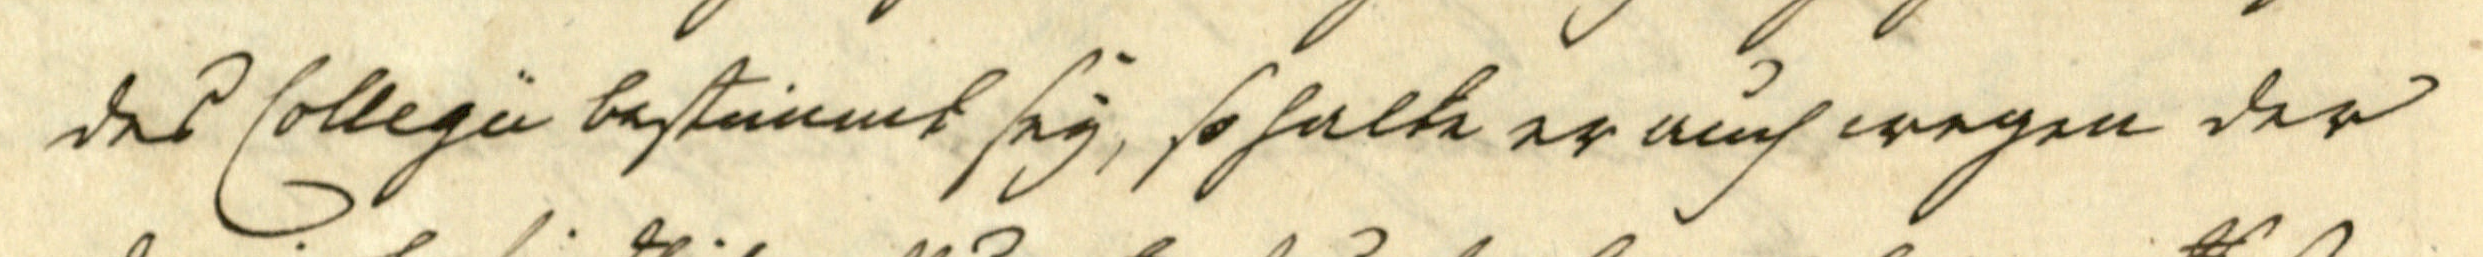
des Collegii bestimmt seÿ, so halte er auch wegen der
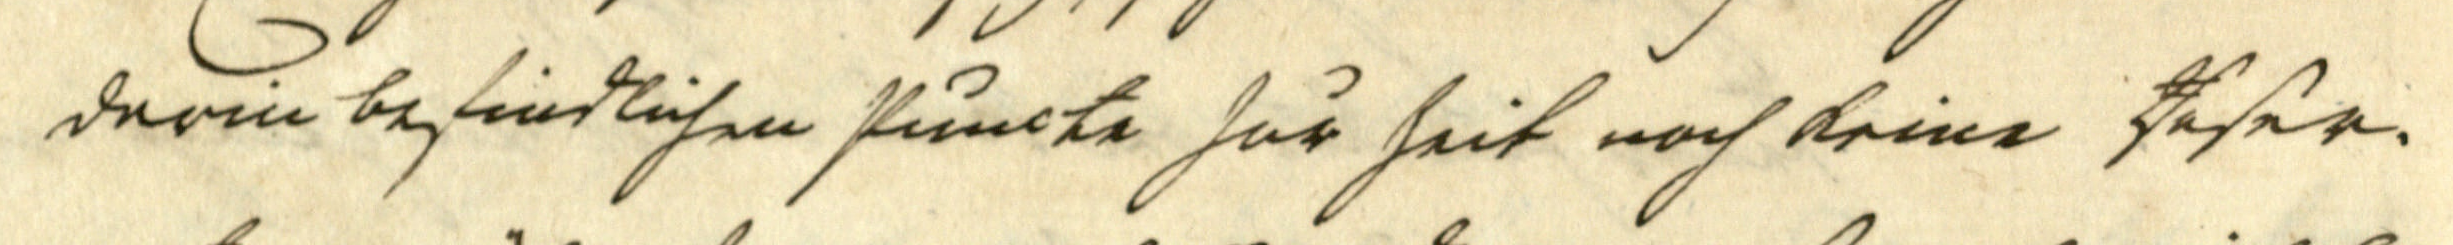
darin befindlichen Puncte zur Zeit noch keine Reser¬
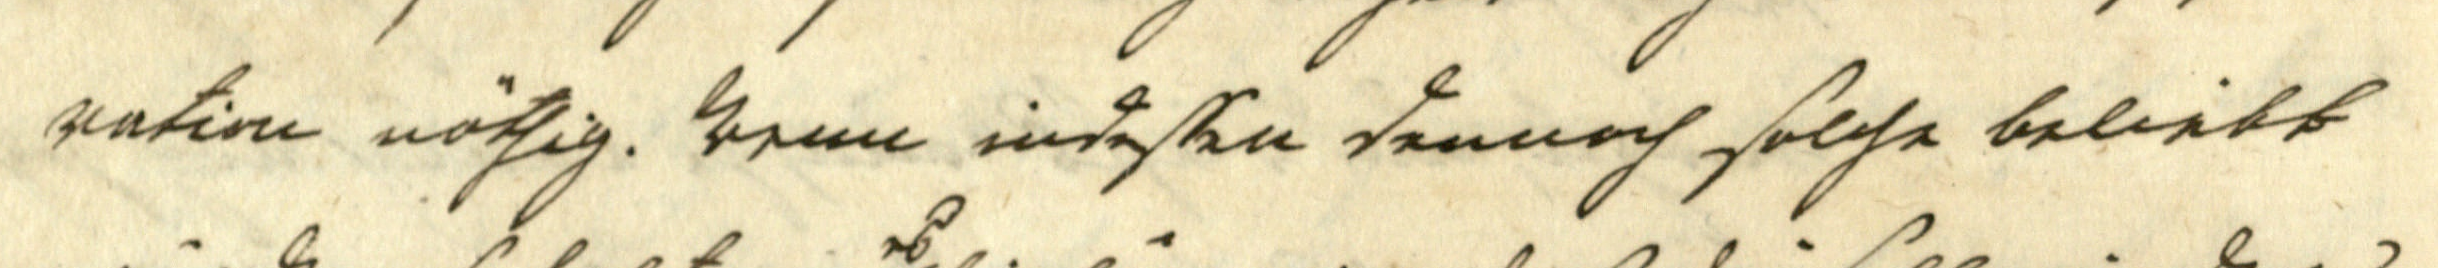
vation nöthig. Wenn indessen dennoch solche beliebt
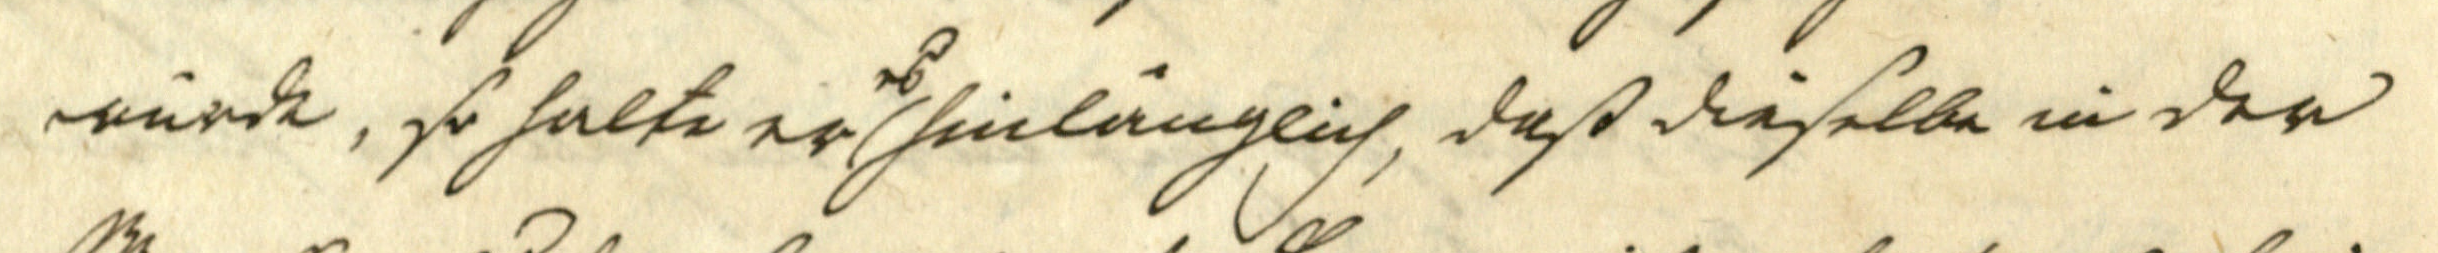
würde, so halte er es hinlänglich, daß dieselbe in der
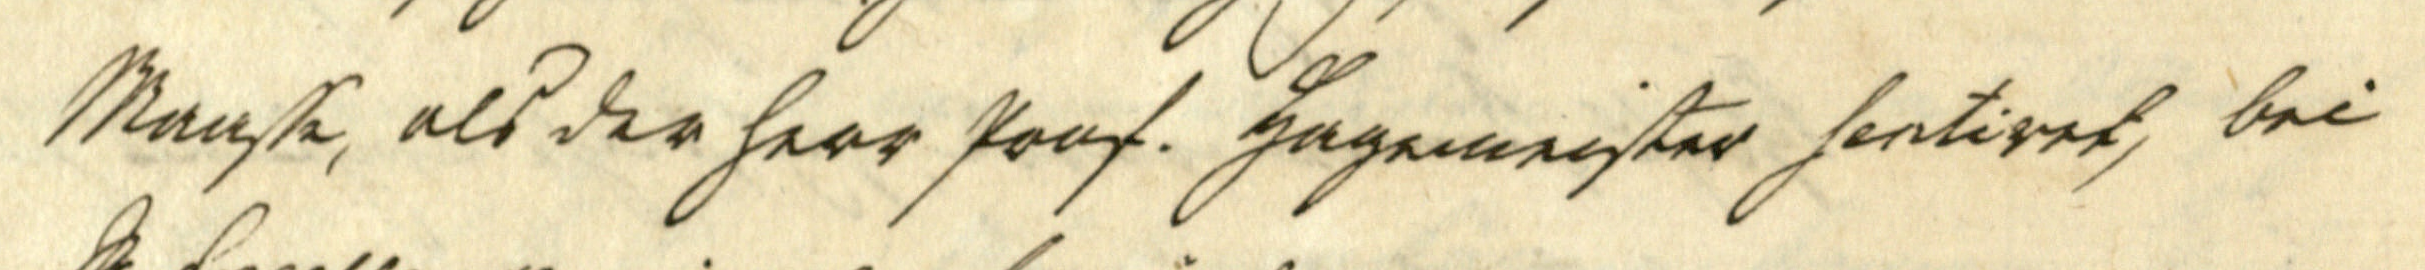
Maasse, als der Herr Prof. Hagemeister sentiret, bei
